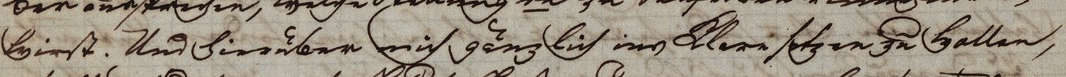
wirst. Und hierüber mich gänzlich ins Klare setzen zu wollen,
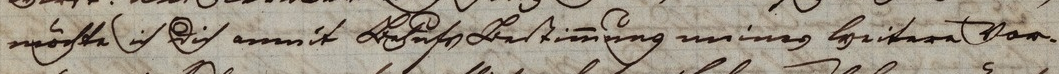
möchte ich Dich anmit Behufs Bestimmung meines weitern Vor-
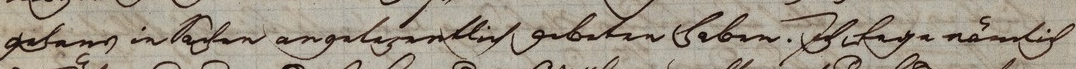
gehens in Sachen angelegentlich gebeten haben. Ich hege nämlich
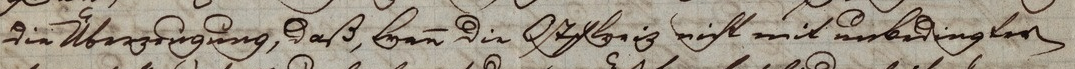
die Überzeugung, daß, wenn die Ostschweiz nicht mit unbedingter
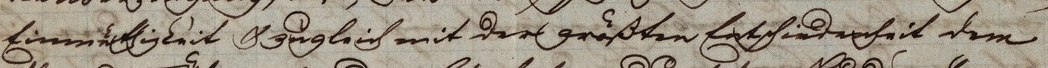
Einmüthigkeit & zugleich mit der größten Entschiedenheit dem
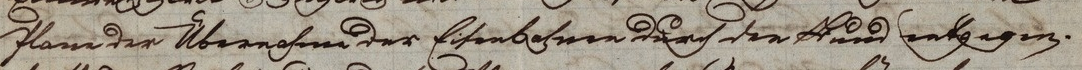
Plane der Übernahme der Eisenbahnen durch den Bund entgegen-
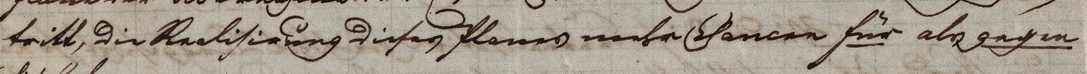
tritt, die Realisirung dieses Planes mehr Chancen für als gegen
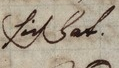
sich hat.
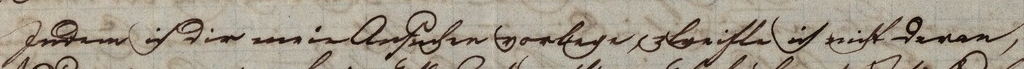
Indem ich dir mein Ansuchen vorlege, zweifle ich nicht daran,
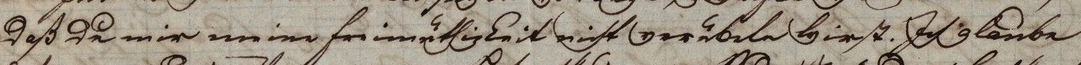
daß Du mir meine Freimüthigkeit nicht verübeln wirst. Ich glaube
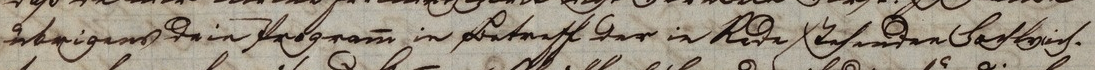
übrigens Dein Programm in Betreff der in Rede stehenden hochwich-
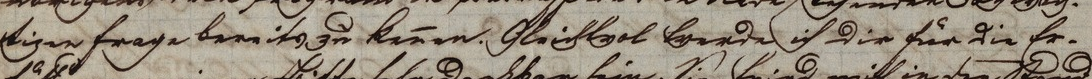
tigen Frage bereits zu kennen. Gleichwol werde ich Dir für die Er-
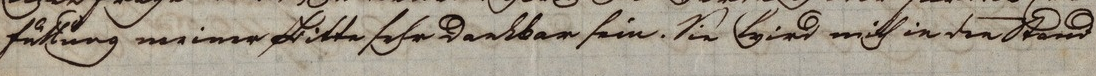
füllung meiner Bitte sehr dankbar sein. Sie wird mich in den Stand
